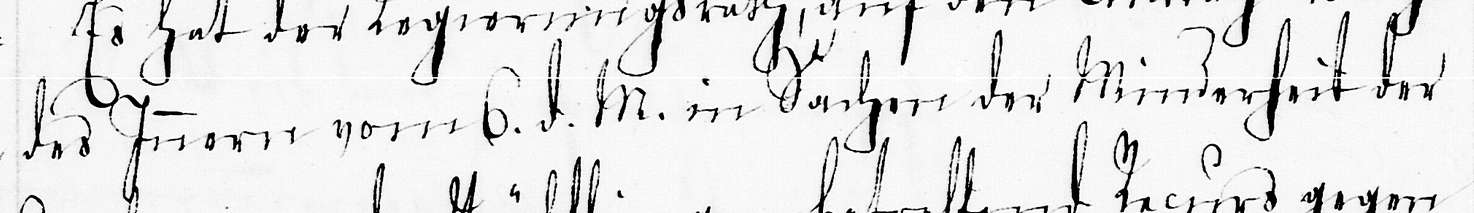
des Innern vom 6. d. M. in Sachen der Minderheit der
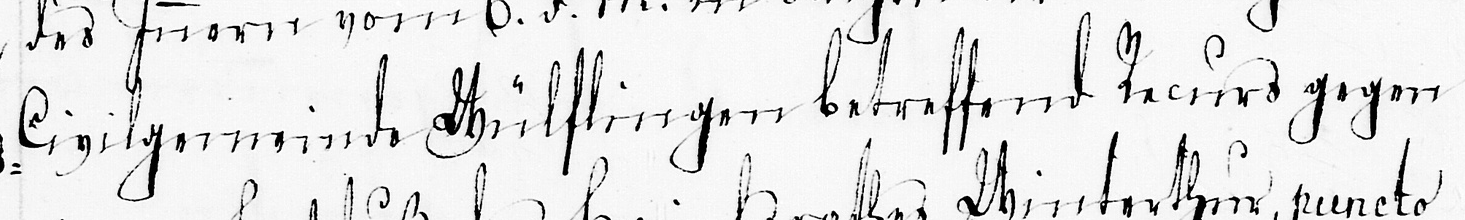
Civilgemeinde Wülflingen betreffend Recurs gegen
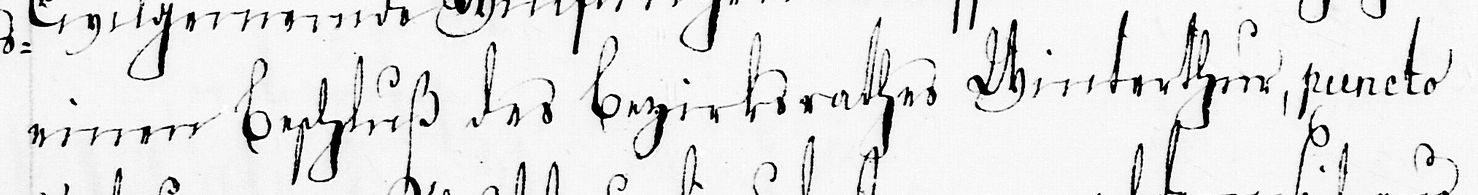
einen Beschluß des Bezirksrathes Winterthur, puncto
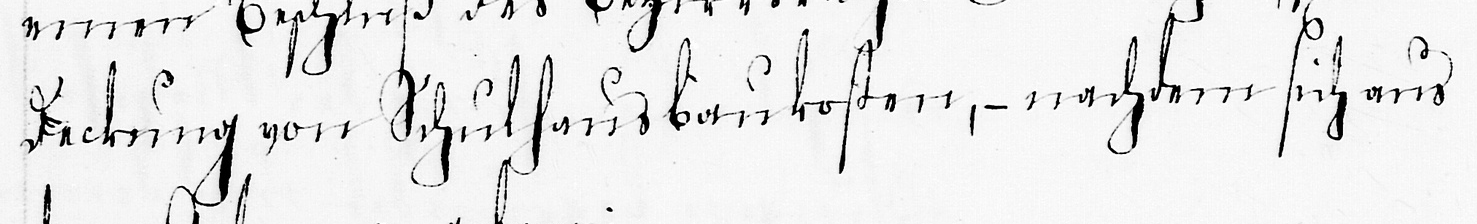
Deckung von Schulhausbaukosten, – nachdem sich aus
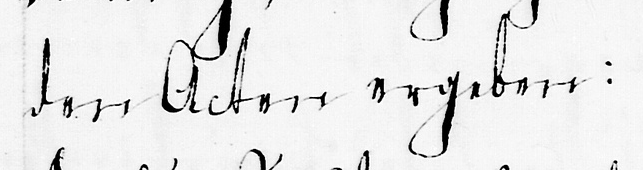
den Acten ergeben:
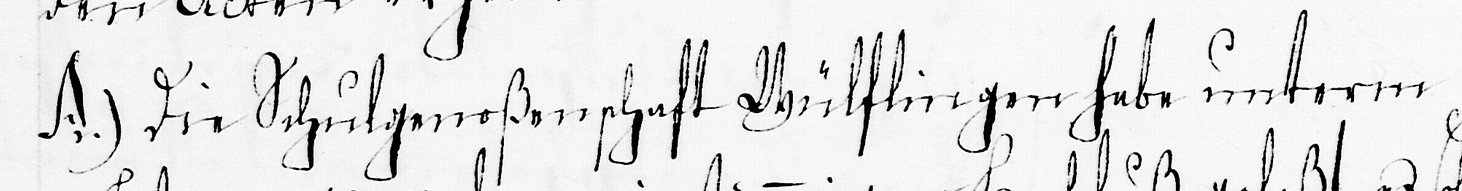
A.) Die Schulgenoßenschaft Wülflingen habe unterm
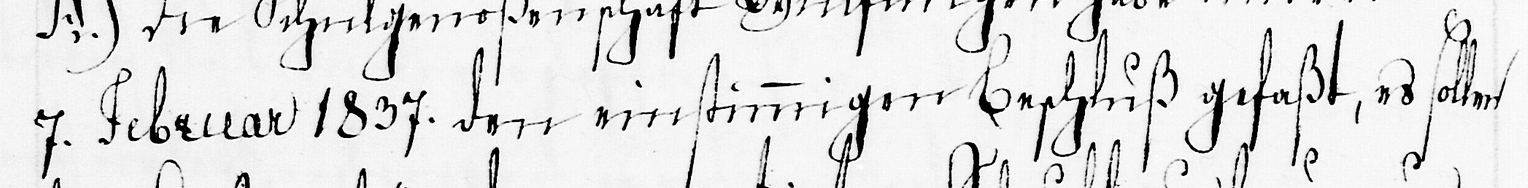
7. Februar 1837. den einstimmigen Beschluß gefaßt, es sol¬
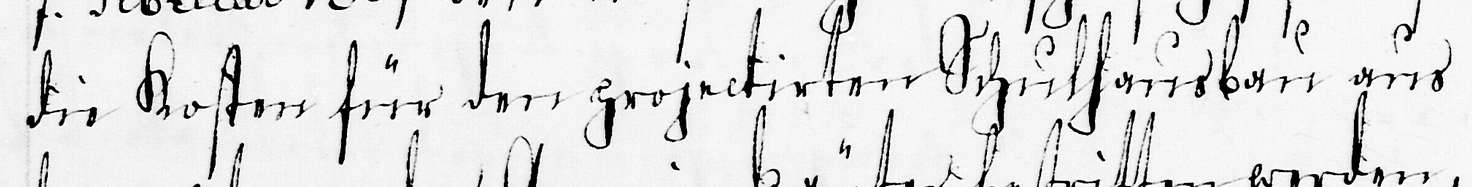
die Kosten für den projectirten Schulhausbau aus
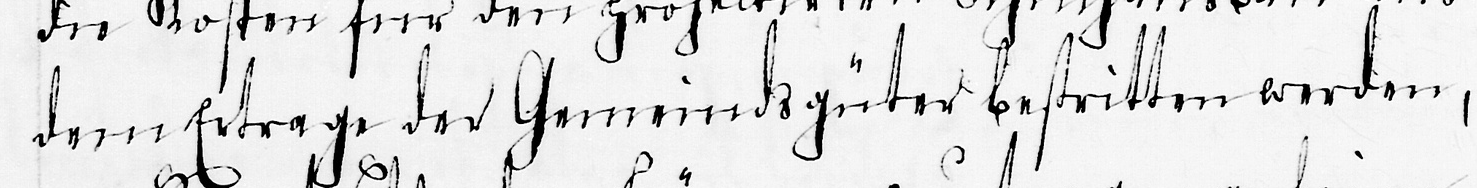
dem Ertrage der Gemeindsgüter bestritten werden,
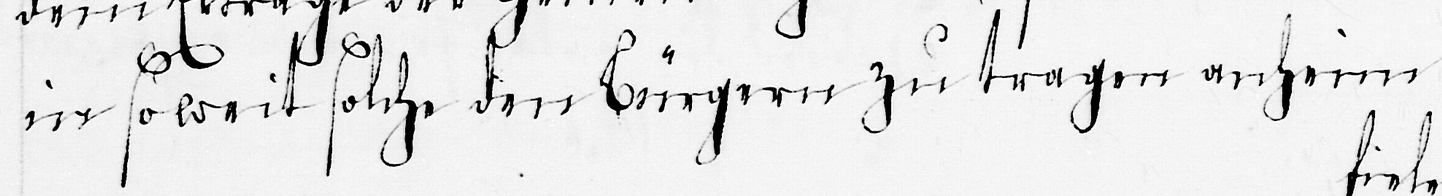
in soweit solche den Bürgern zu tragen anheim
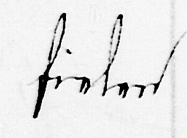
len
